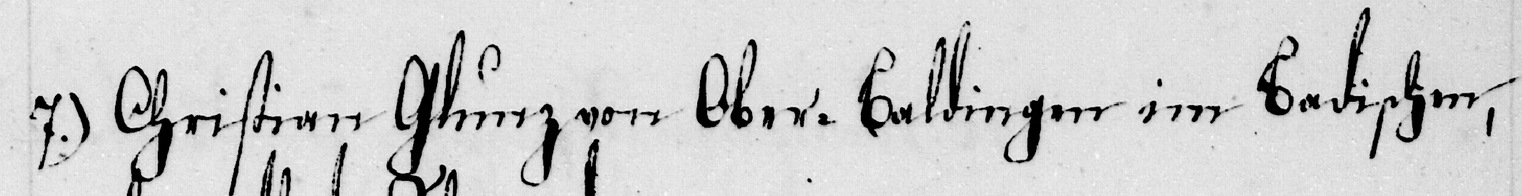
7.) Christian Glunz von Ober-Baldingen im Badischen,
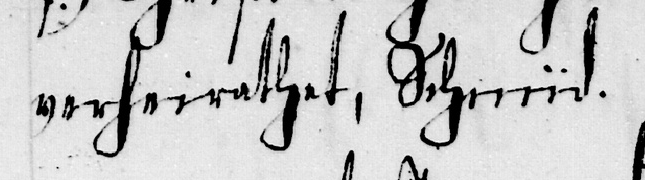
verheirathet, Schmid.
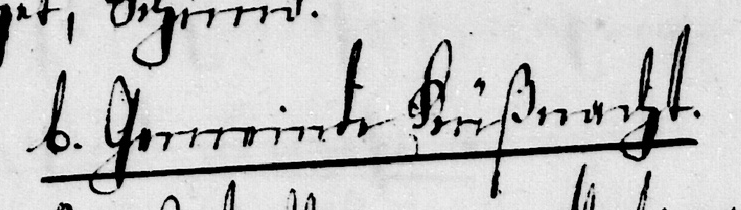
b.) Gemeinde Küßnacht.
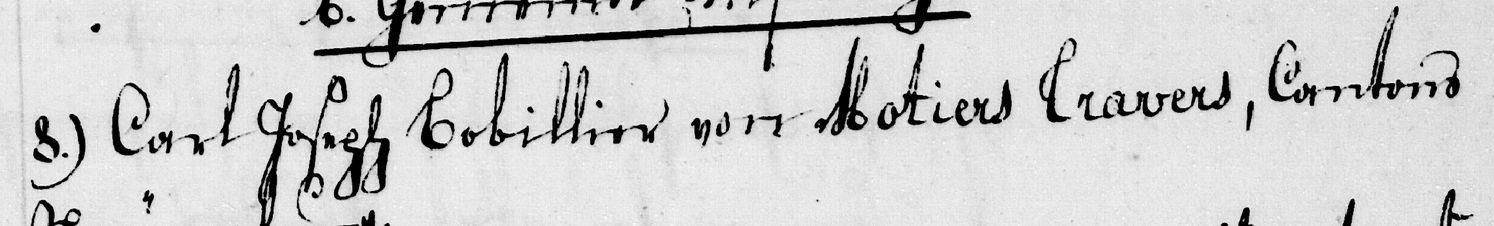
8.) Carl Joseph Bobillier von Motiers Travers, Cantons
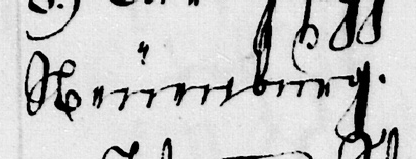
Neuenburg.
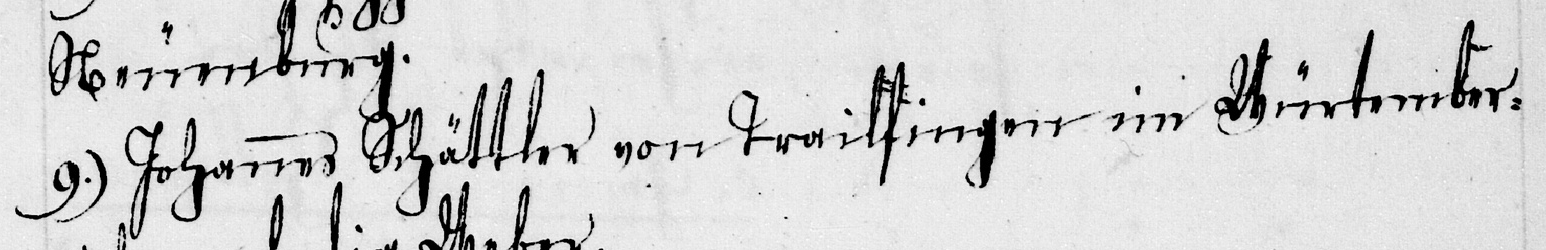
9.) Johannes Schättler von Trailfingen im Würtember¬
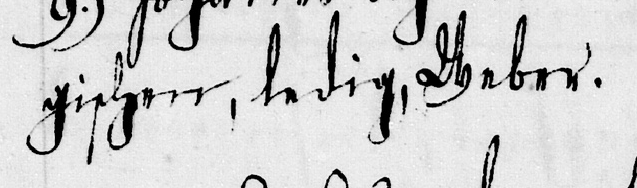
gischen, ledig, Weber.
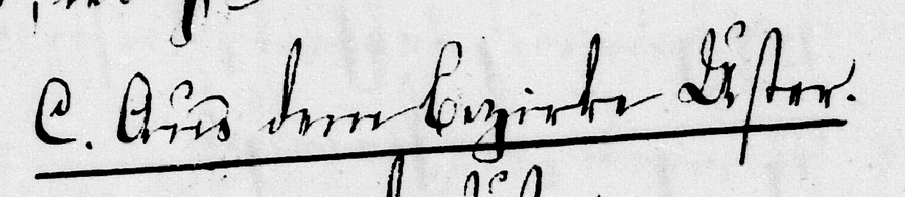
C. Aus dem Bezirke Uster.
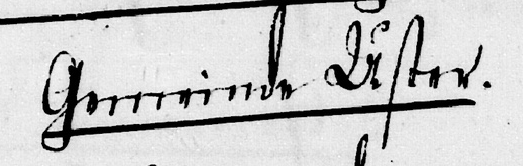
Gemeinde Uster.
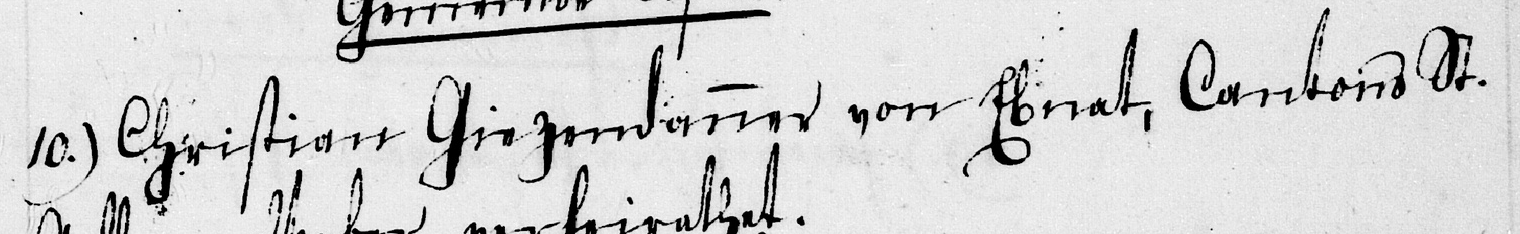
10.) Christian Giezendanner von Ebnat, Cantons St.
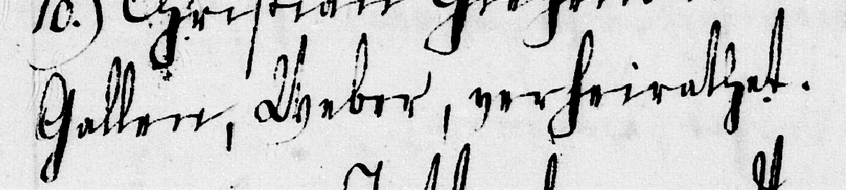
Gallen, Weber, verheirathet.
